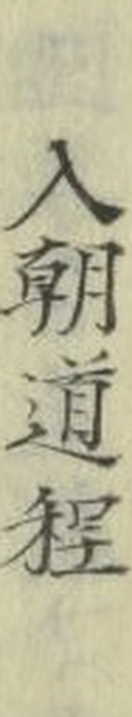入朝道程
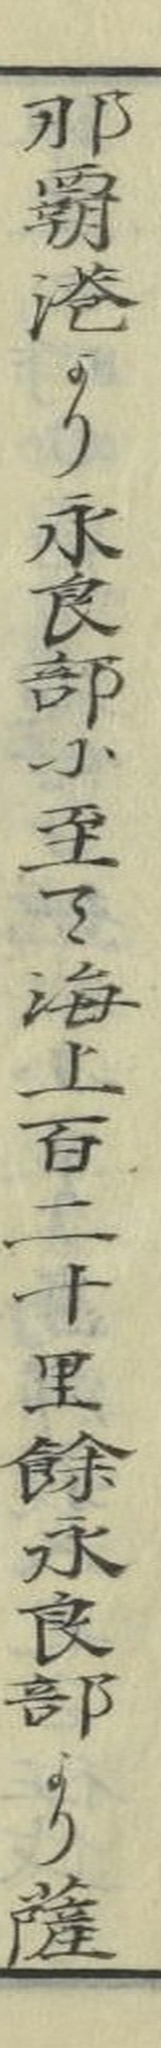那覇港より永良部に至て海上百二十里餘永良部より薩
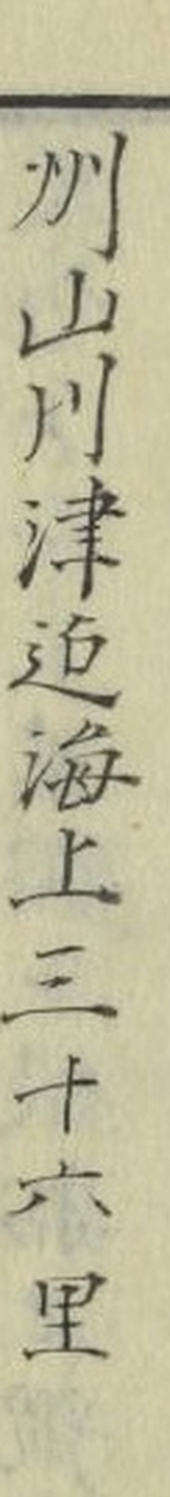州山川津迄海上三十六里
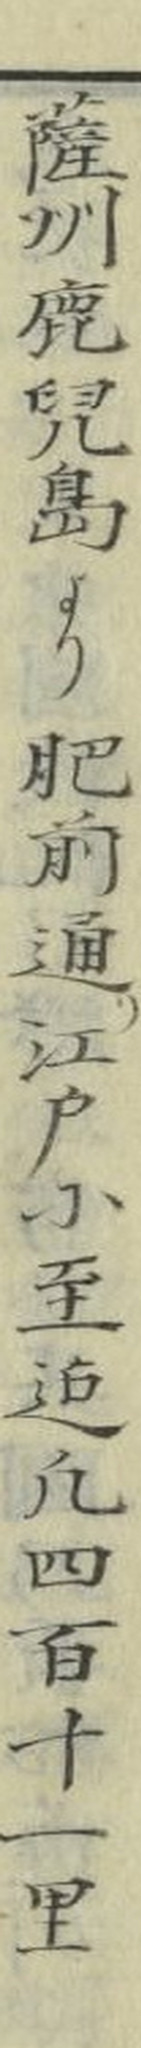薩州鹿児島より肥前通江戸に至迄凡四百十一里
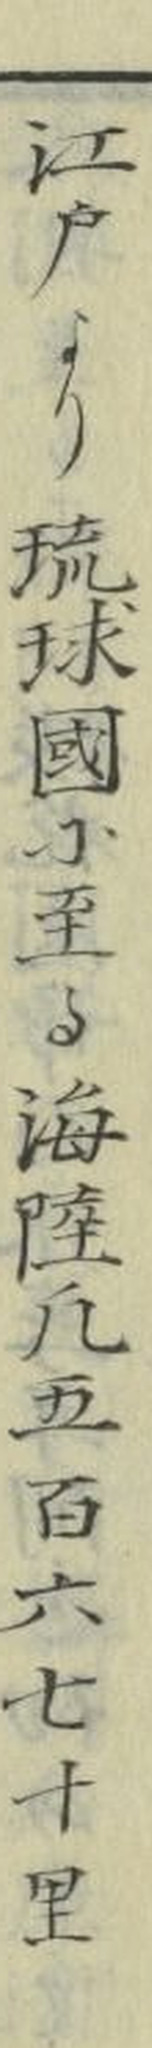江戸より琉球国に至る海陸凡五百六七十里
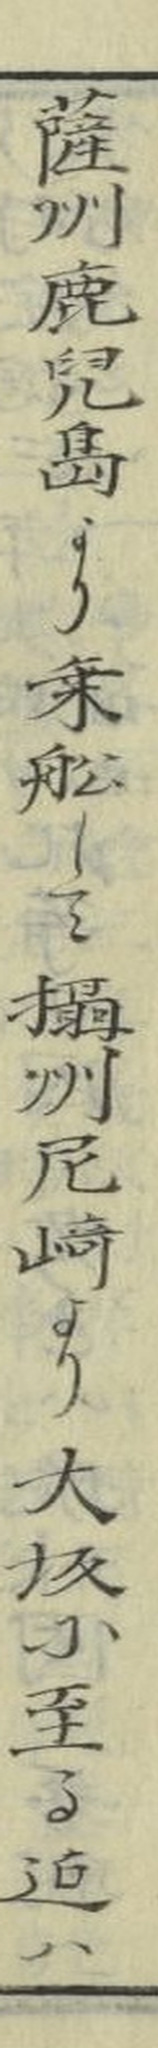薩州鹿児島より乗舩して摂州尼崎より大坂に至る迄は
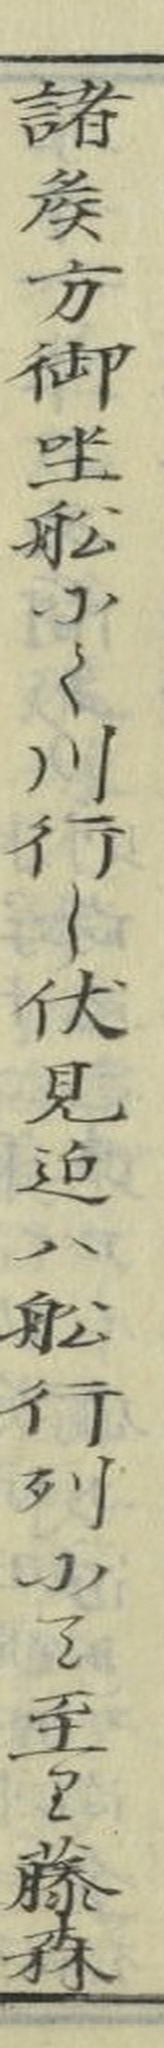諸侯方御座舩にて川行し伏見迄は舩行列にて至り藤森
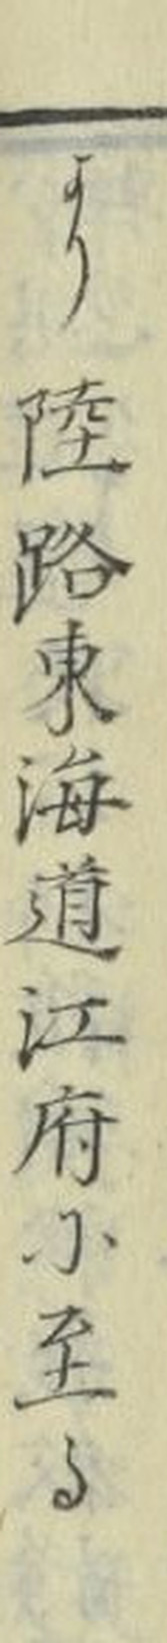より陸路東海道江府に至る
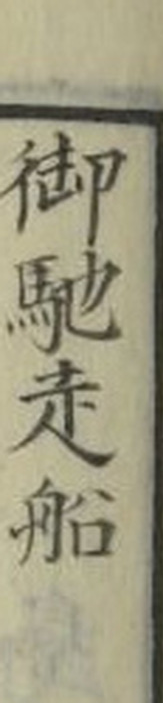御馳走船
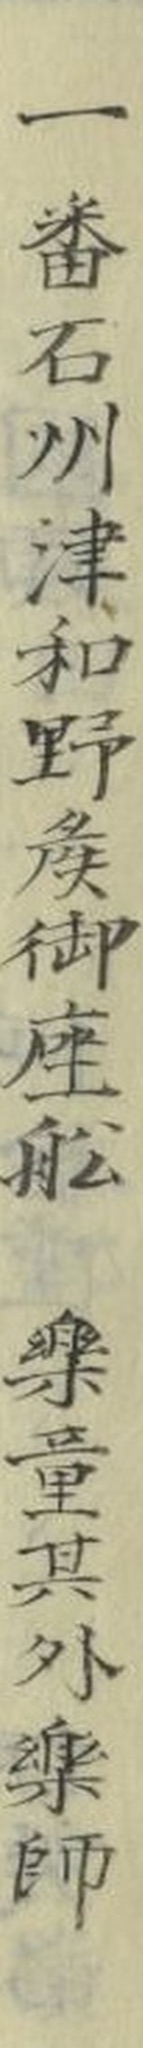一番石州津和野侯御座舩楽童其外楽師
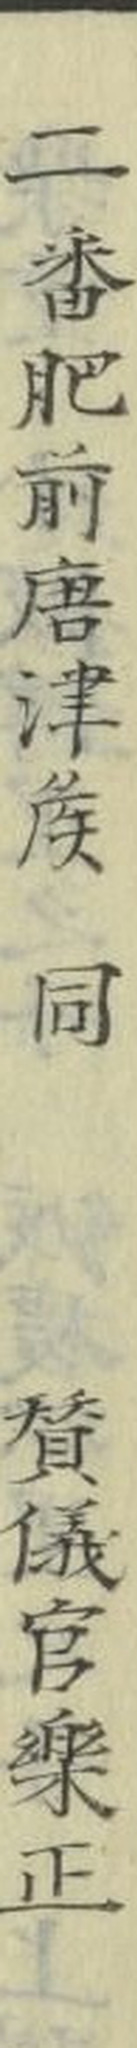二番肥前唐津侯同賛儀官楽正
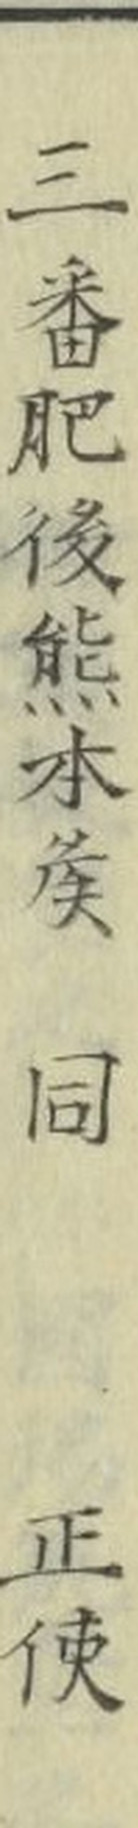三番肥後熊本侯同正使
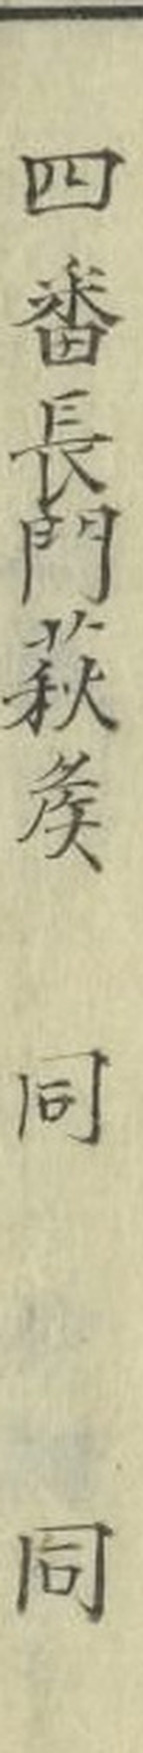四番長門萩侯同同
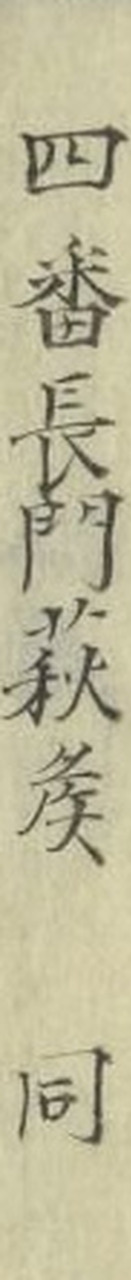四番長門萩侯同同
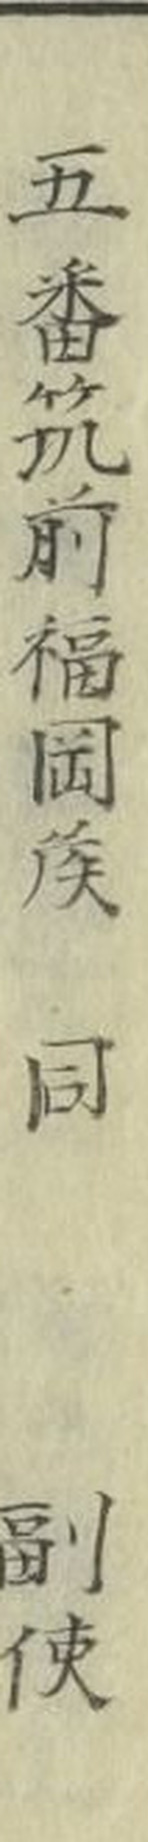五番筑前福岡侯同副使
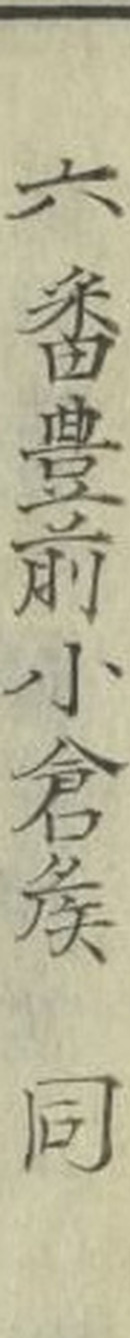六番豊前小倉侯同同
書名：琉球沿革志 下
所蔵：University of the Ryukyus Library
